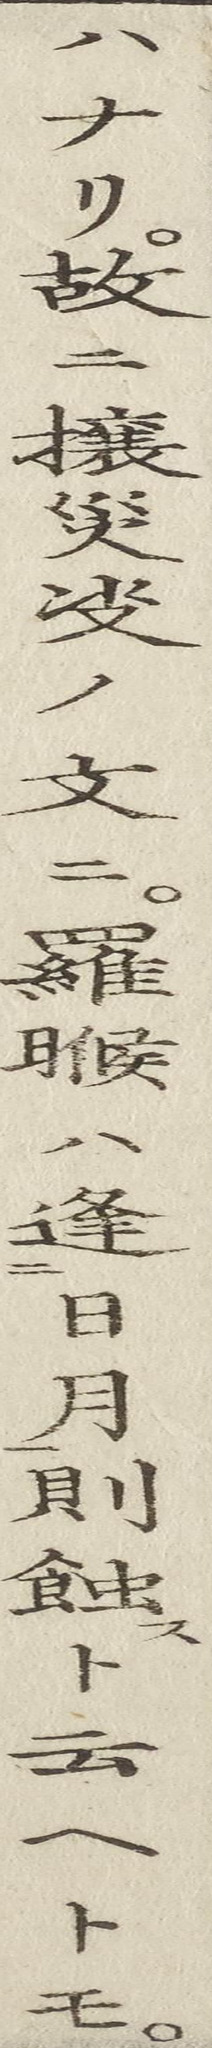ハナリ。故ニ攘災決ノ文ニ。羅睺ハ逢ニ日月則蝕云ヘトモ。
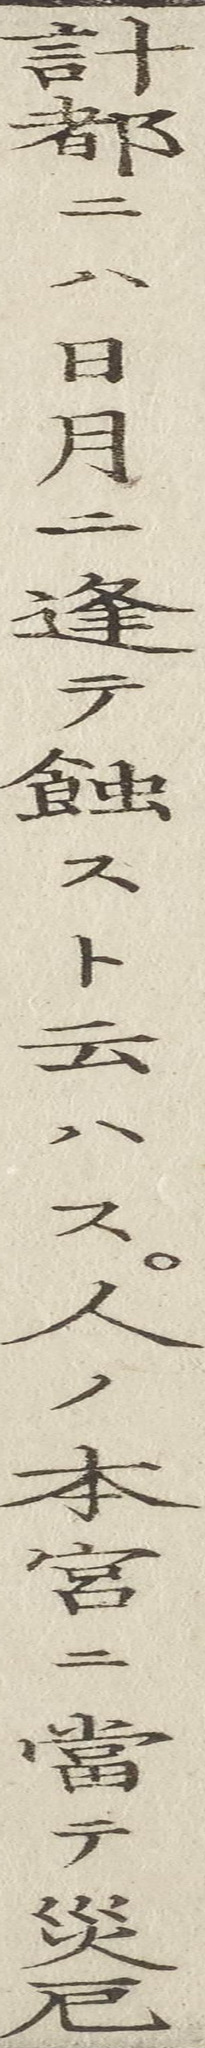計都ニハ日月ニ逢テ蝕スト云ハス。人ノ本宮ニ当テ災厄
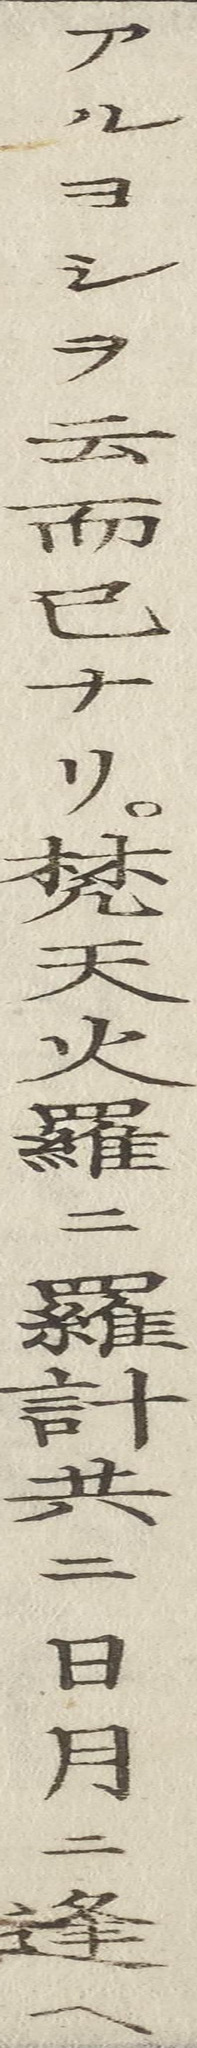アルヨシヲ云而已ナリ。梵天火羅ニ羅計共ニ日月ニ逢ヘ
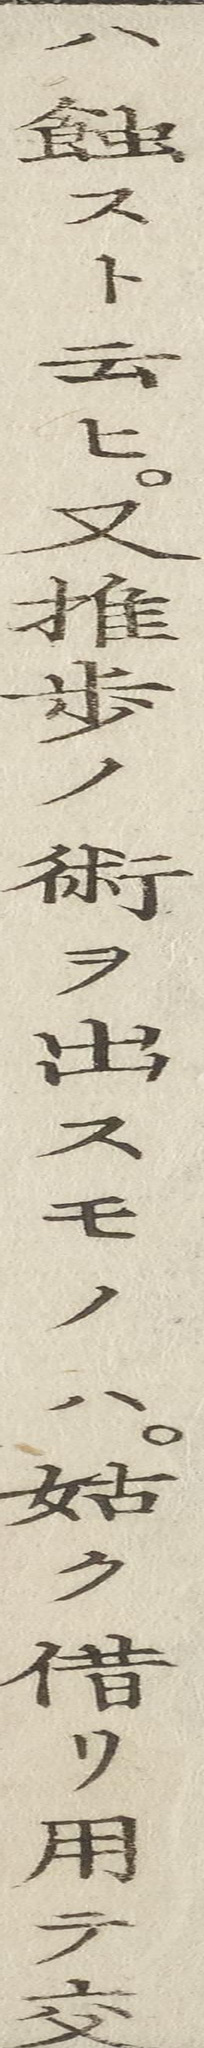ハ蝕スト云ヒ。又推歩ノ術ヲ出スモノハ。姑ク借リ用テ交
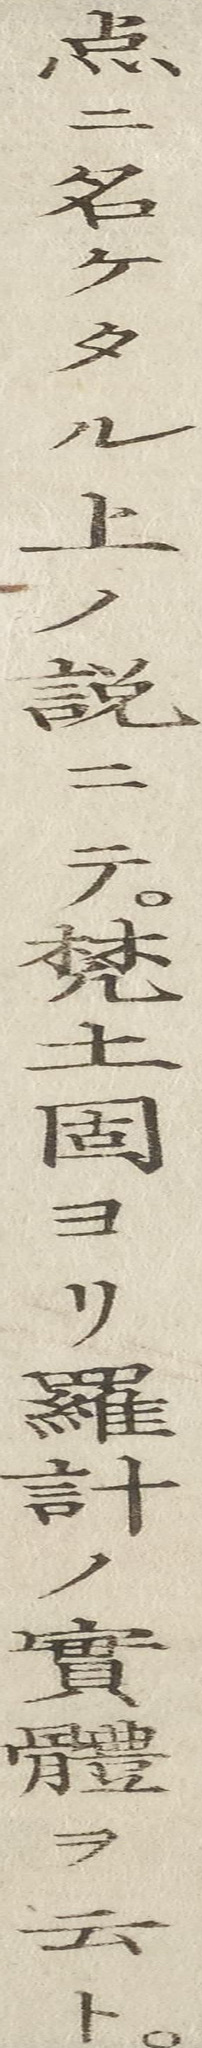点ニ名ケタル上ノ説ニテ。梵天固ヨリ羅計ノ実体ヲ云ト。
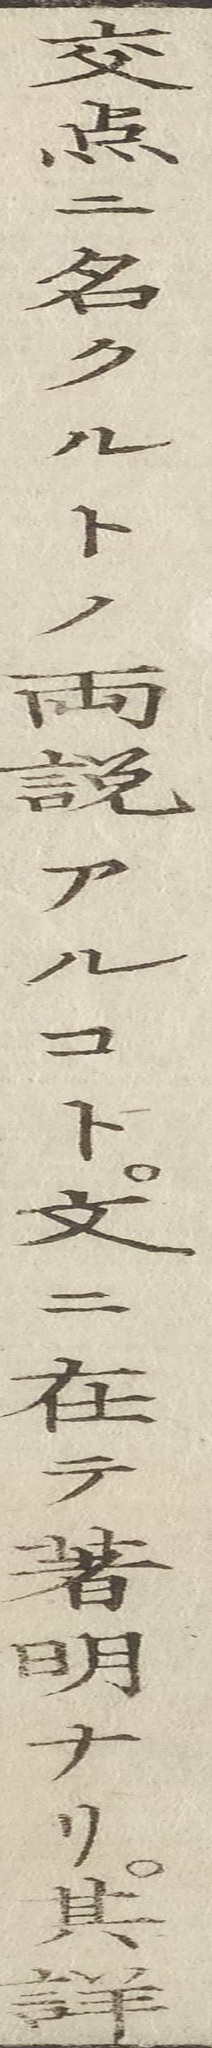交点ニ名クルトノ両説アルコト。文意ニ在テ著明ナリ。其詳
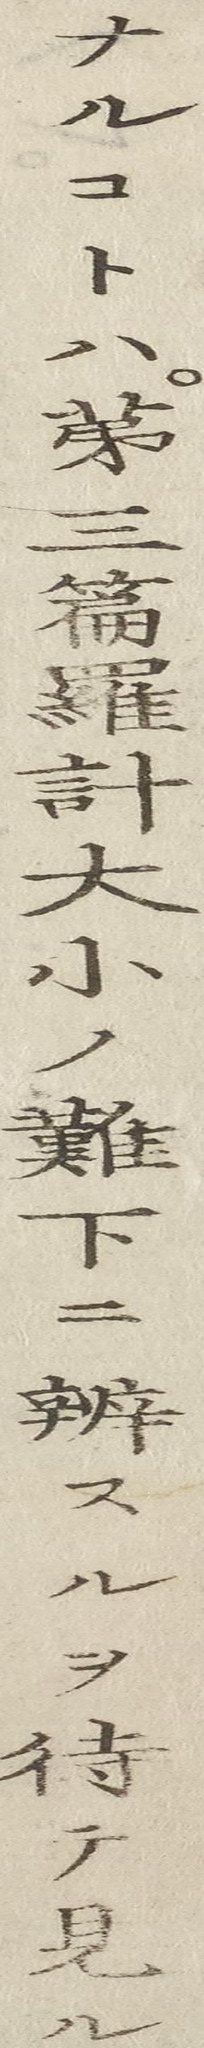ナルコトハ。第三篇羅計大小ノ難下ニ弁スルヲ待テ見ル

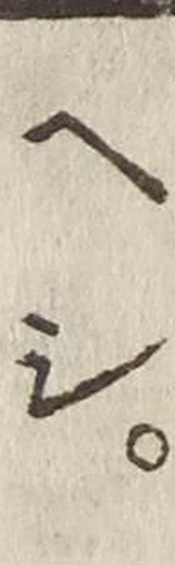ヘシ。
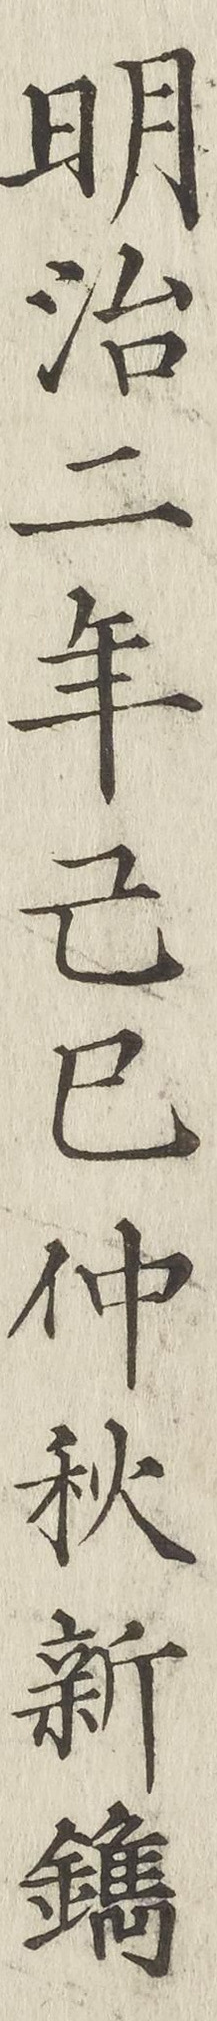明治二年己巳仲秋新鐫
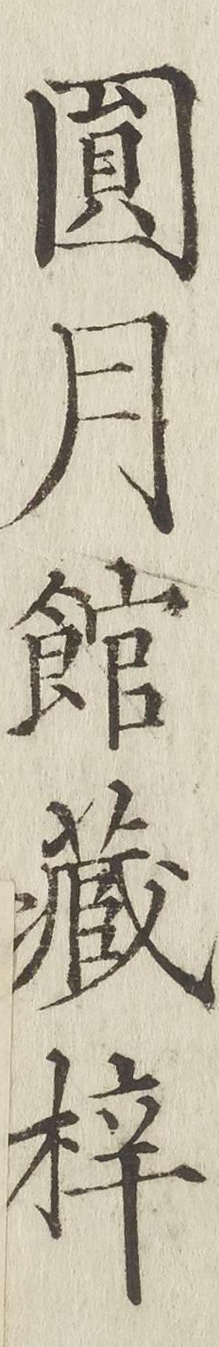圓月館蔵梓
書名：護法新論　二編　下
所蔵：東京大学地震研究所図書室 Earthquake Research Institute Library, The University of Tokyo, JAPAN
